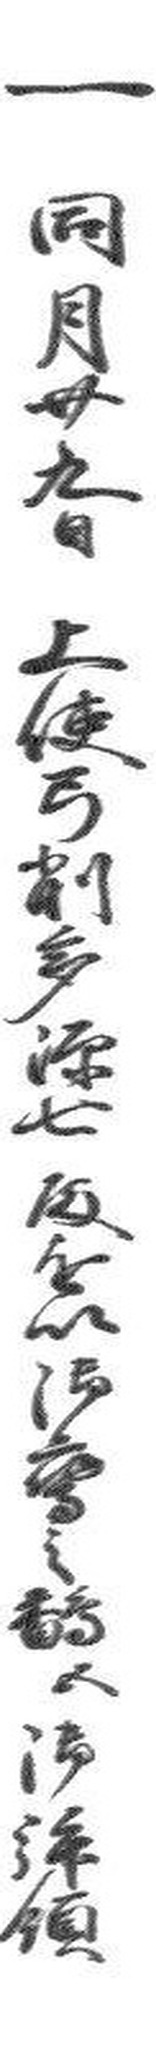一同月廿九日上使弓削多源七殿を以御鷹之鷭五御拝領
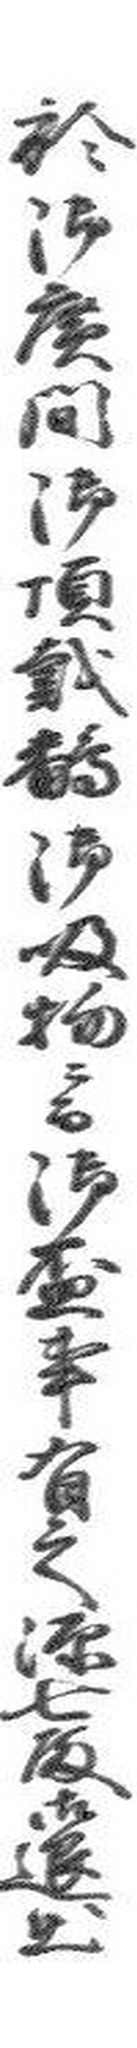於御広間御頂戴鷭御吸物ニ而御盃事有之源七殿御退出
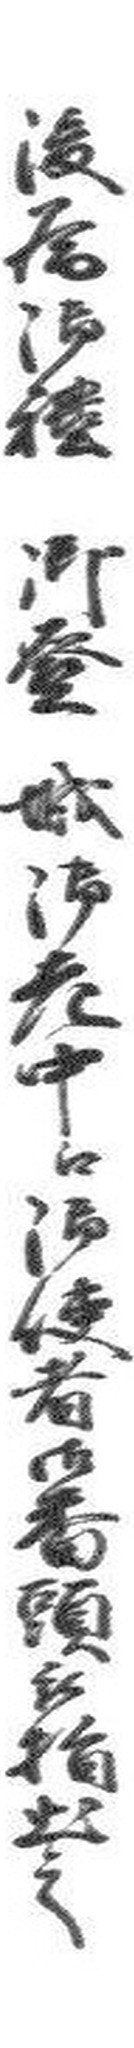後為御礼御登城御老中江御使者御番頭被指出之
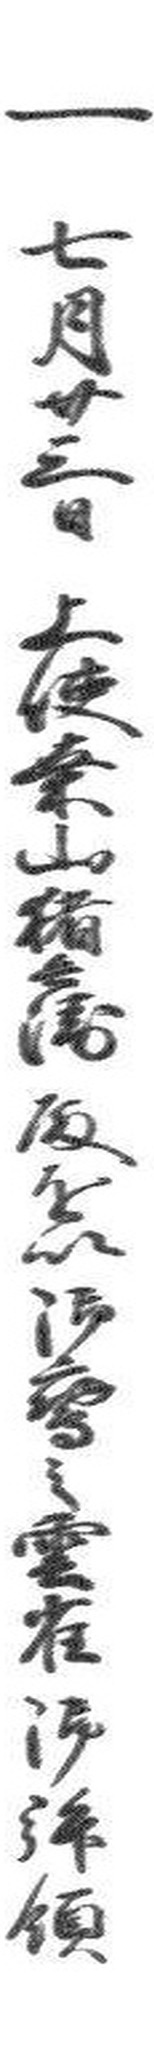一七月廿三日上使桑山猪兵衛殿を以御鷹之雲雀御拝領
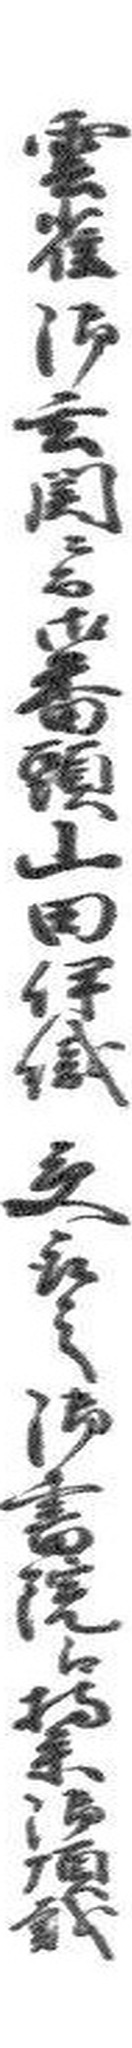雲雀御玄関ニ而御番頭山田伊織受取之御書院江持参御頂戴
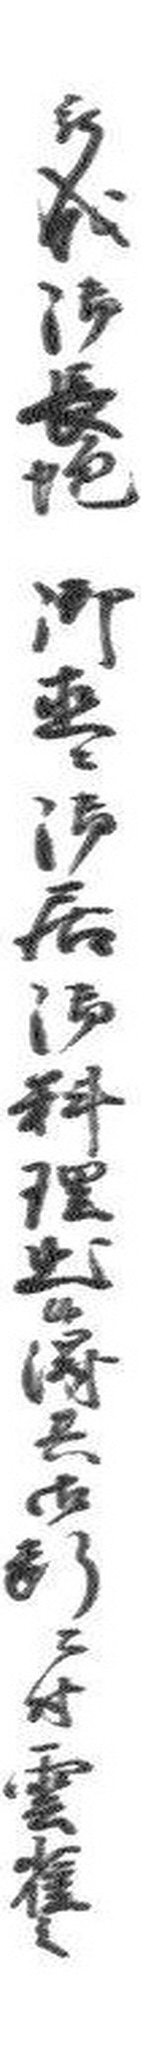被成御長蚫御直ニ御居御料理出候得共御断ニ付雲雀之
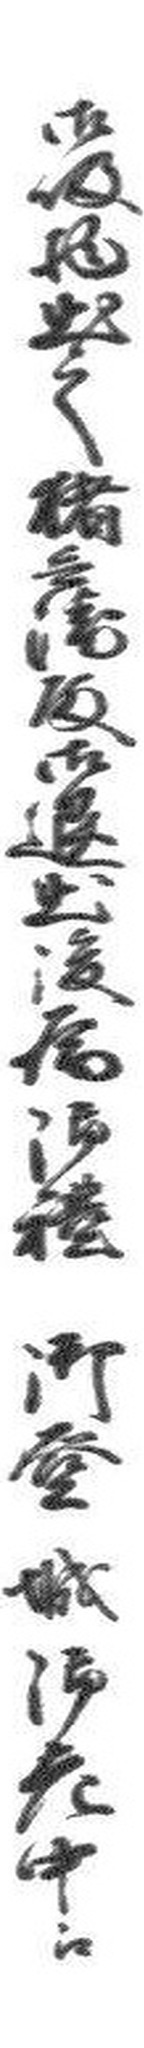御吸物出之猪兵衛殿御退出後為御礼御登城御老中江
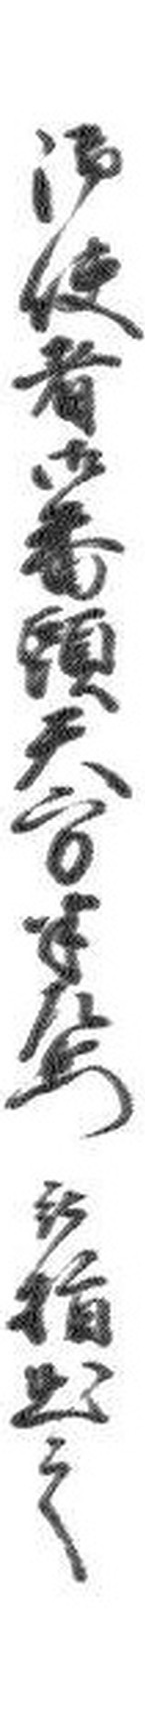御使者御番頭天方半左衛門被指出之
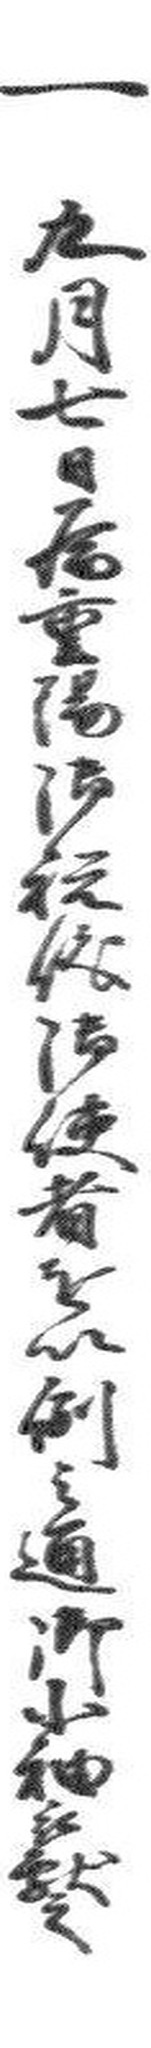一九月七日為重陽御祝儀御使者を以例之通御小袖被献之

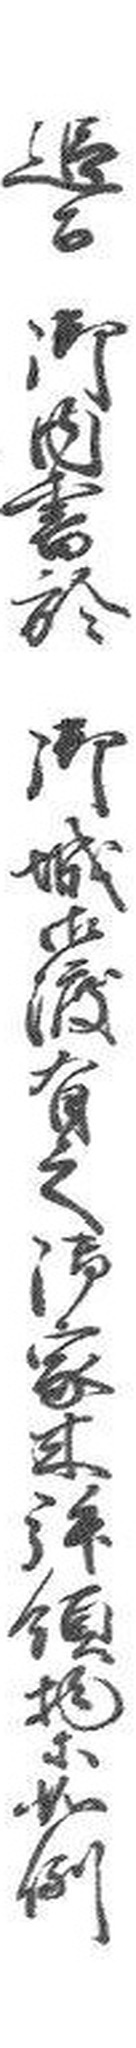追而御内書於御城御渡有之御家来拝領物等如例
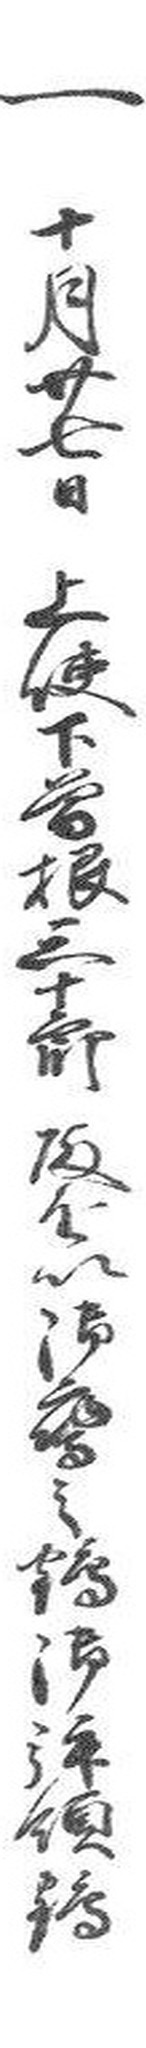一十月廿七日上使下曾根三十郎殿を以御鷹之鶴御拝領鶴
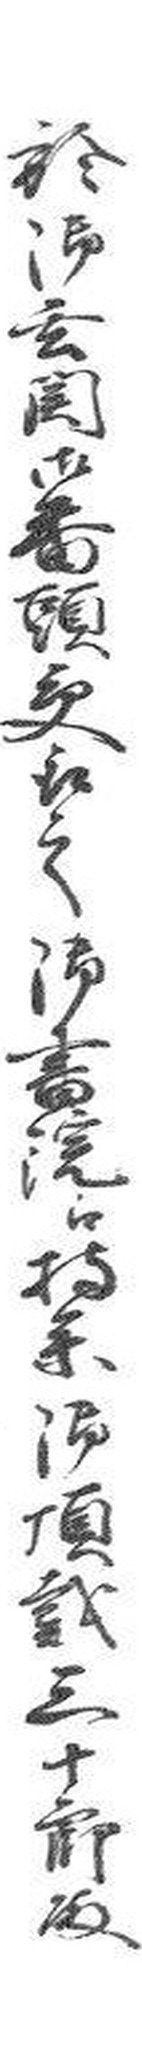於御玄関御番頭受取之御書院江持参御頂戴三十郎殿
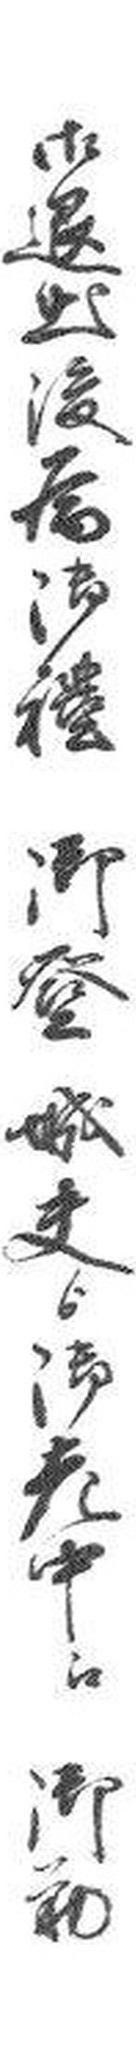御退出後為御礼御登城夫ゟ御老中江御勤
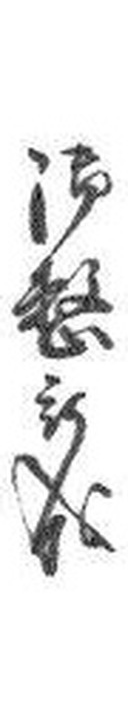御整被成
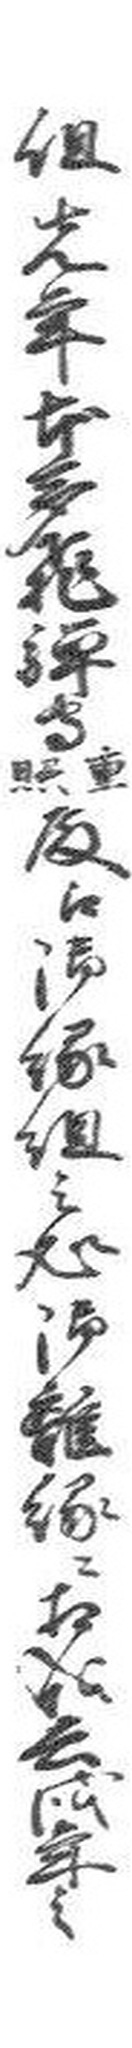但先年本多飛騨守重照殿江御縁組之処御離縁ニ相成去戌年之
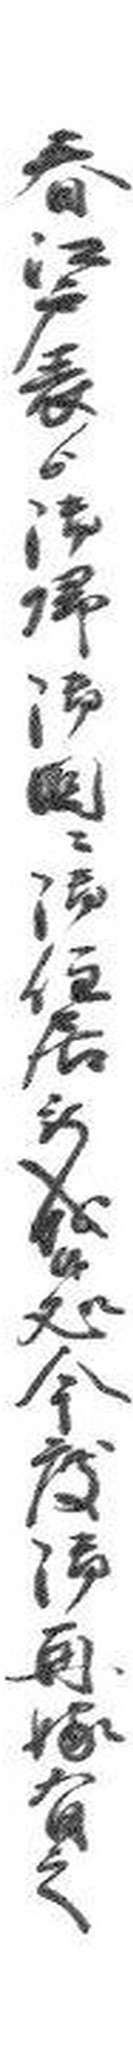春江戸表ゟ御帰御国ニ御住居被成候処今度御再嫁有之
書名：家譜 六 光通公 従万治三年到寛文三年
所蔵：福井県文書館 Fukui Prefectural Archives
